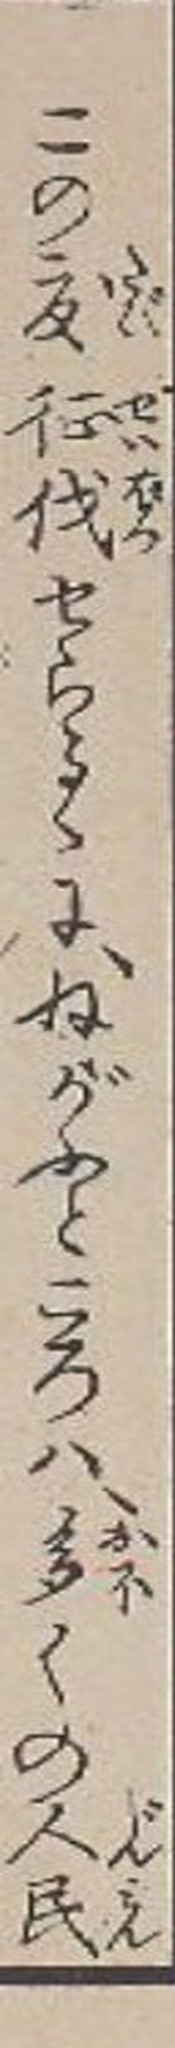この度征伐せらるゝに、ねがふところは、多くの人民
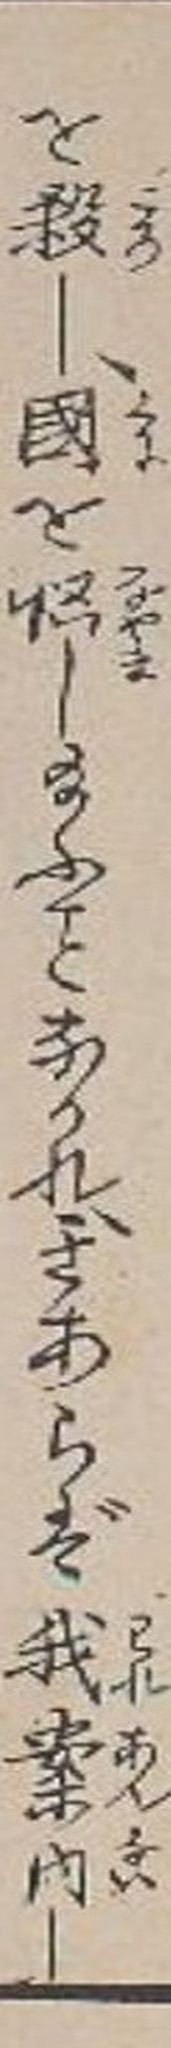を殺し、国を悩し給ふことなかれ、さあらば我案内し
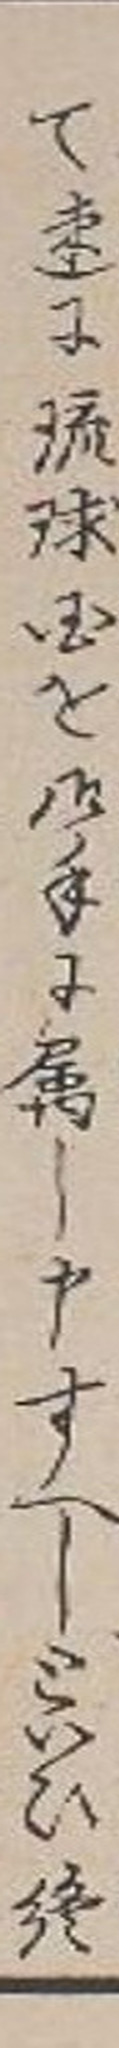て、速に琉球国を御手に属し申すへし、といひ終
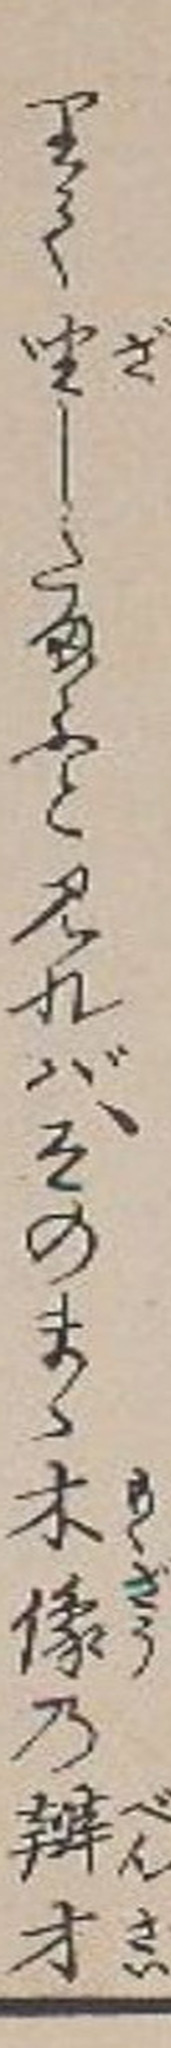りて坐したまふと見れば、そのまゝ木像の弁才
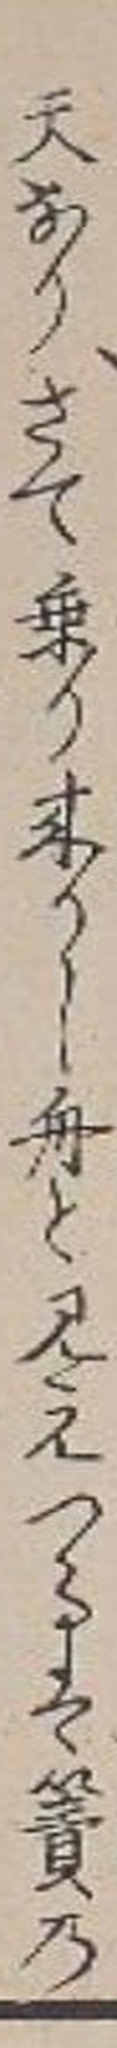天なり、さて乗り来りし舟と見えつるは、簀の
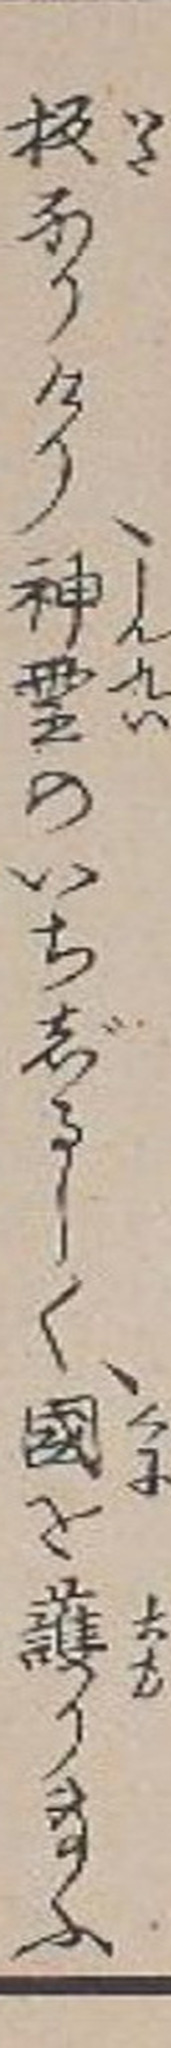板なりけり、神霊のいちじるしく、国を護り給ふ
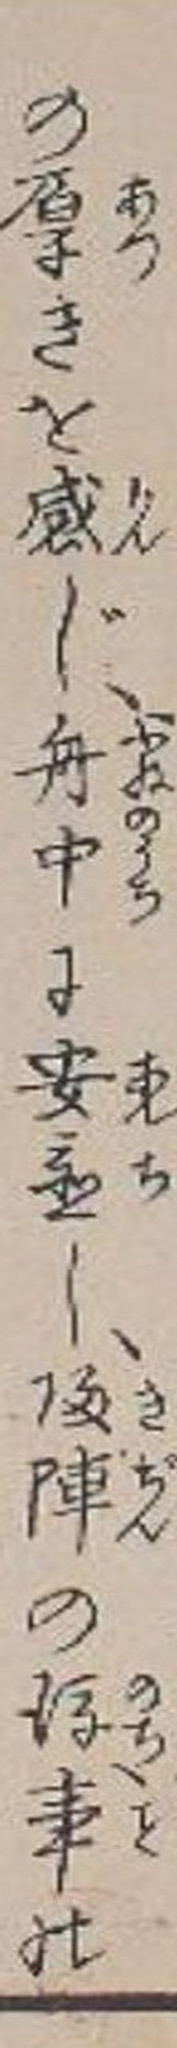の厚きを感じ、舟中に安置し、帰陣の後、事の
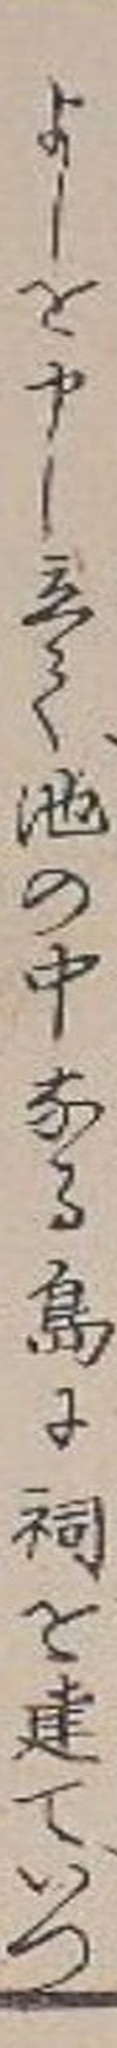よしを申し立て、池の中なる島に祠を建て、いつ

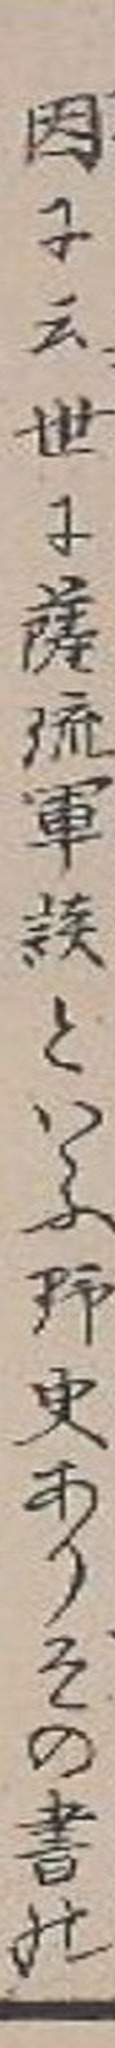因に云、世に薩琉軍談といふ野史あり、その書の
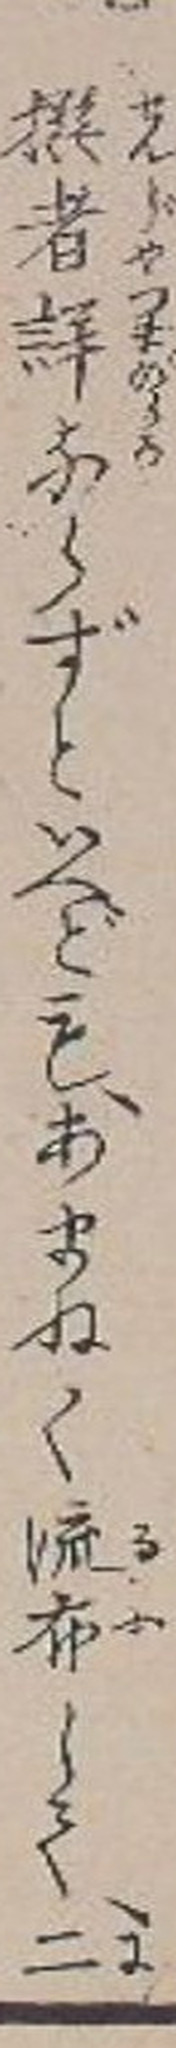撰者詳ならずといへども、あまねく流布して、二
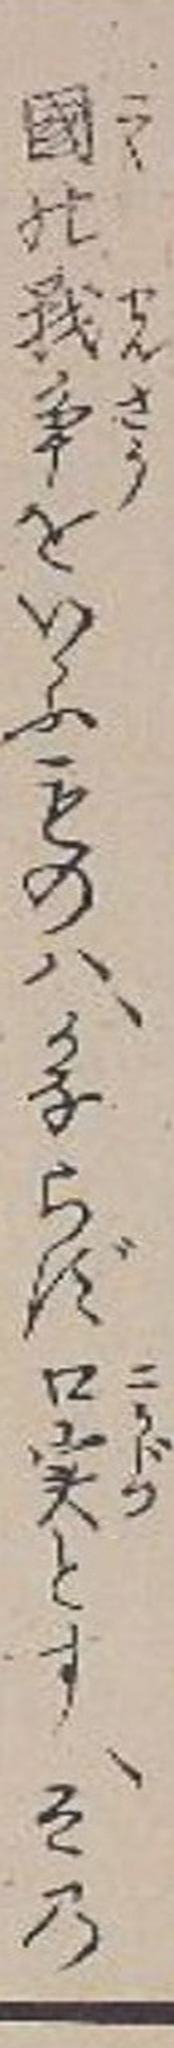国の戦争をいふものは、かならず口実とす、その
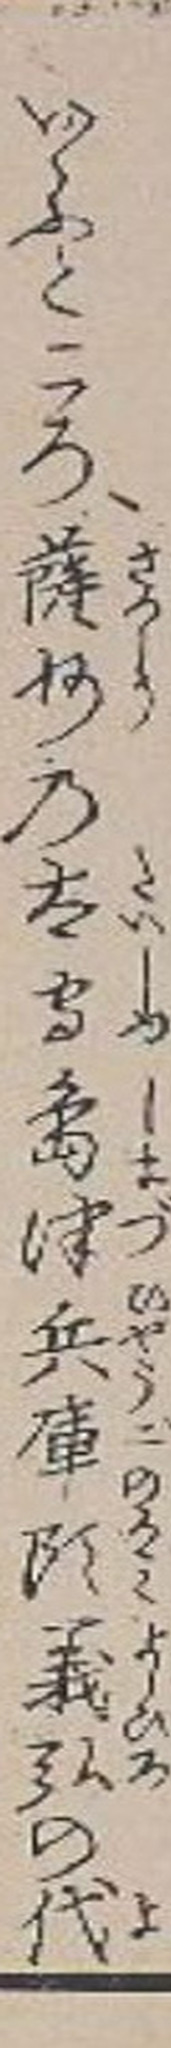いふところ、薩州の太守島津兵庫頭義弘の代
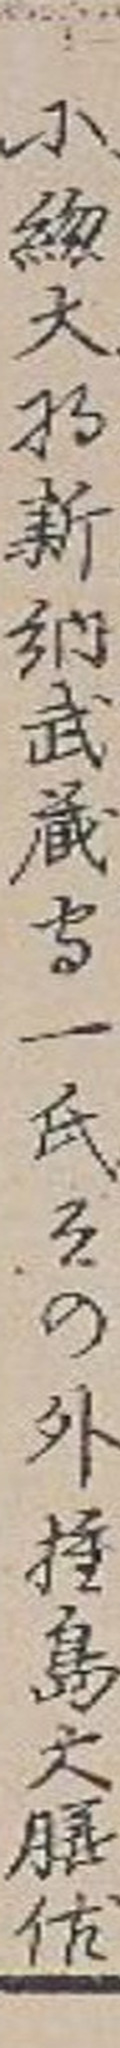に、惣大将新納武蔵守一氏、その外種島大膳、佐
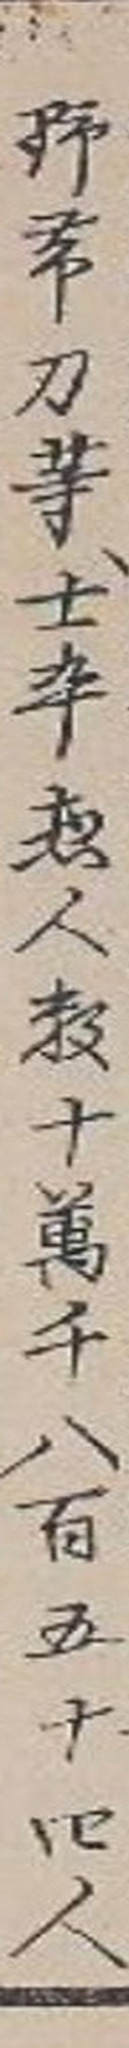野帯刀等、士卒惣人数十万千八百五十四人
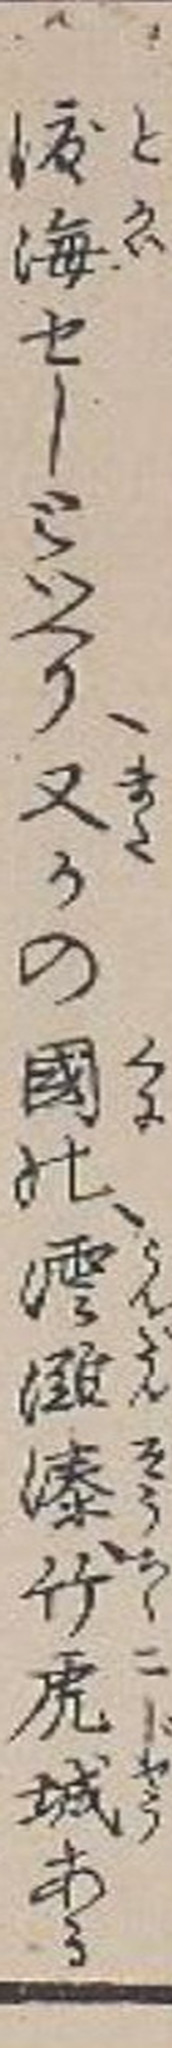渡海せしといへり、又かの国の、澐灘湊、竹虎城ある
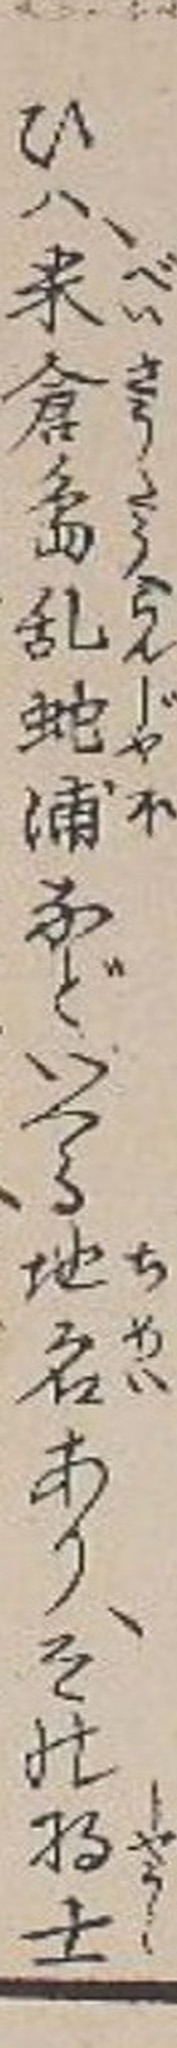ひは、米倉島、乱蛇浦などいへる地名あり、その将士
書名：琉球入貢紀略
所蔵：University of the Ryukyus Library
